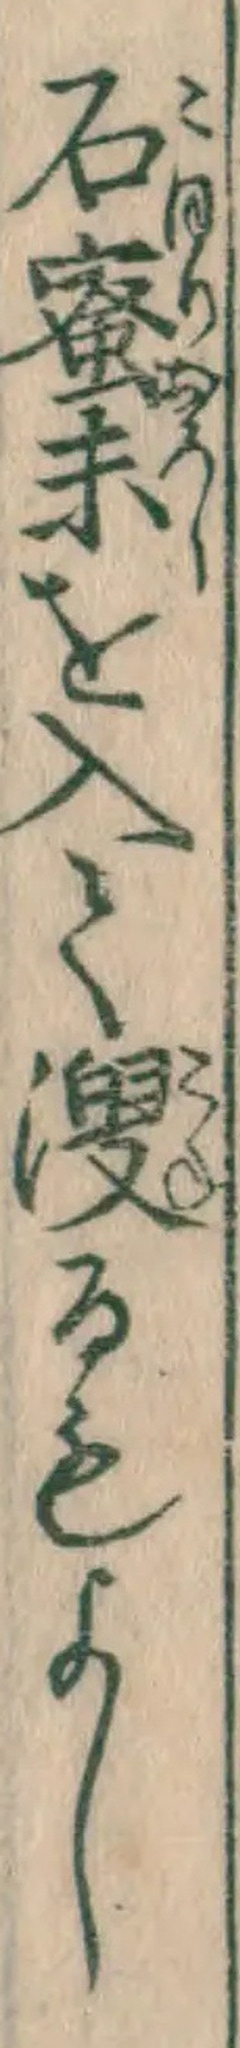石蜜末を入て溲るもよし
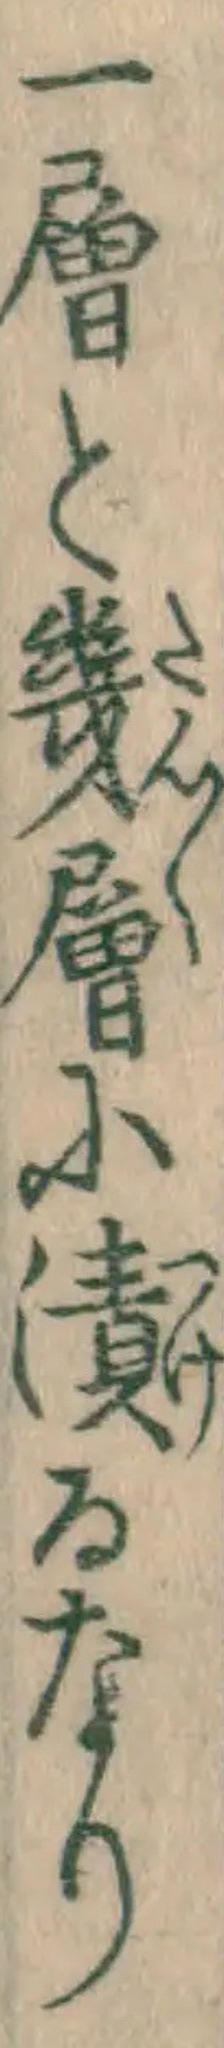一層と幾層に漬るなり

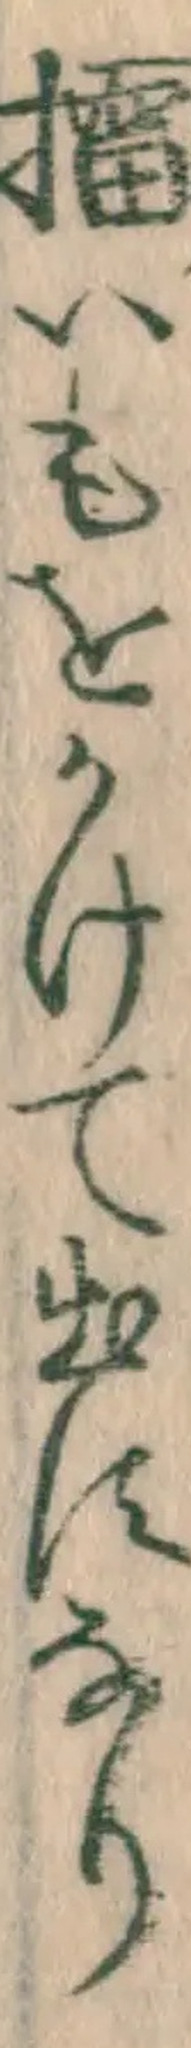擂いもをかけて出すなり
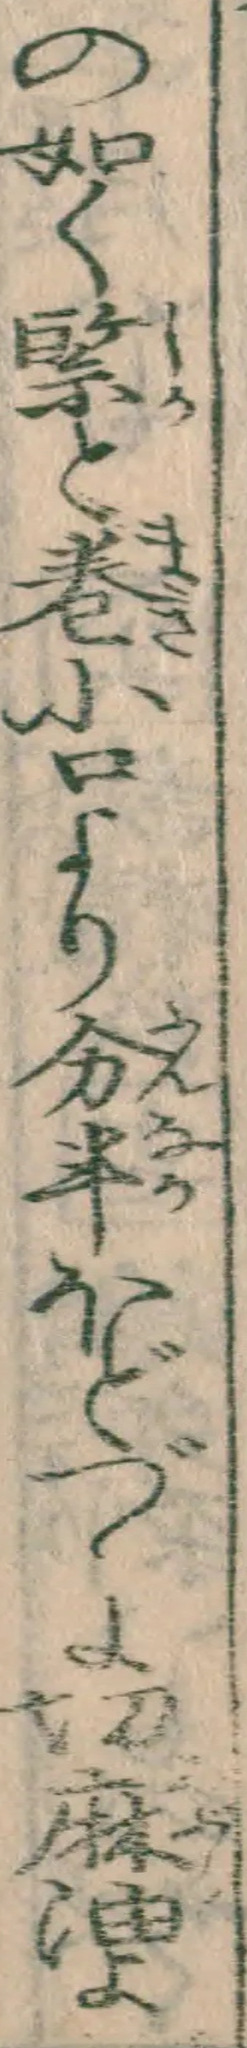の如く緊と巻小口より分半ほどづゝに切麻油よ
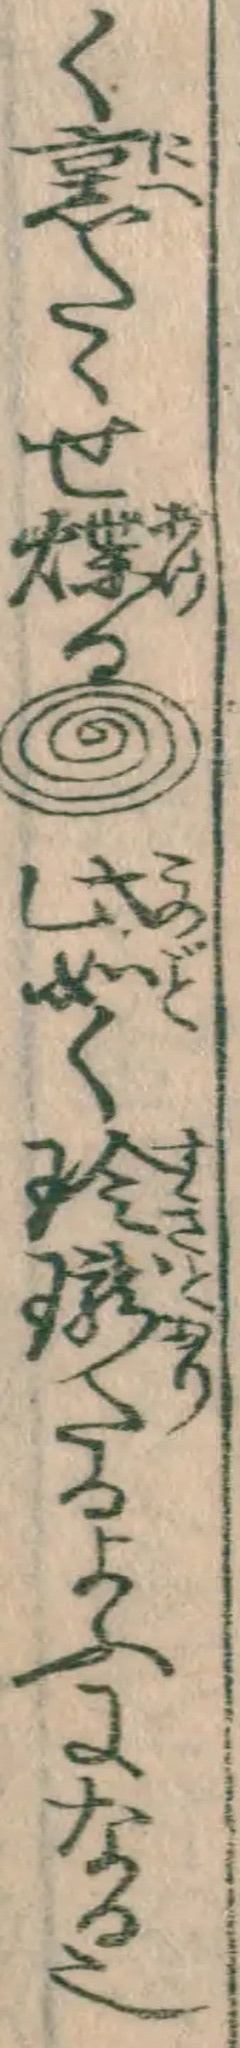く烹たゝせ煠る此如く玲瓏たるよふになる也
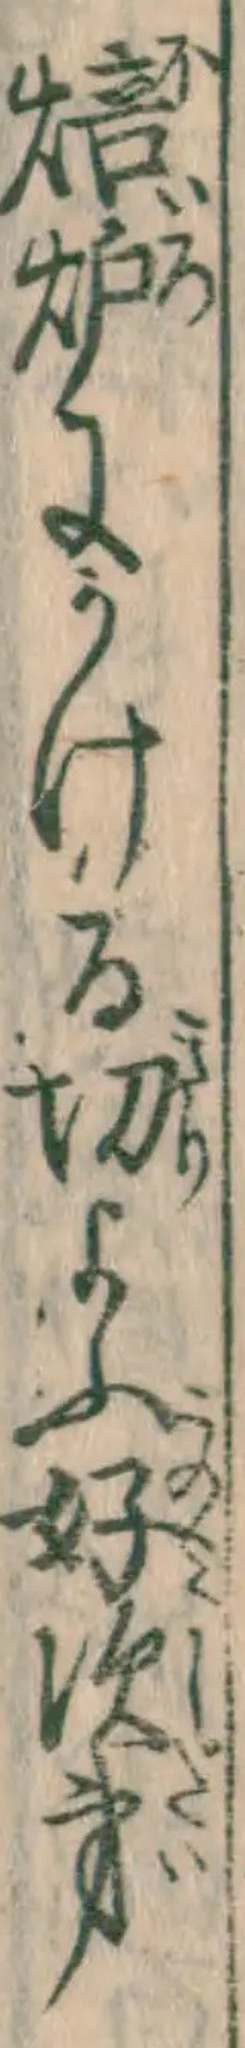焙炉にかける切よふ好次第
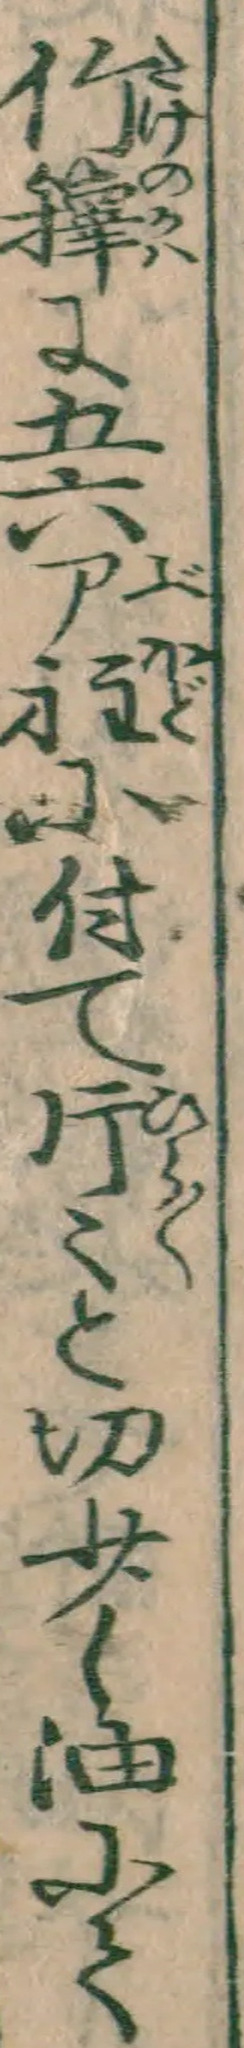竹籜に五六部程に付て片々と切少し油にて
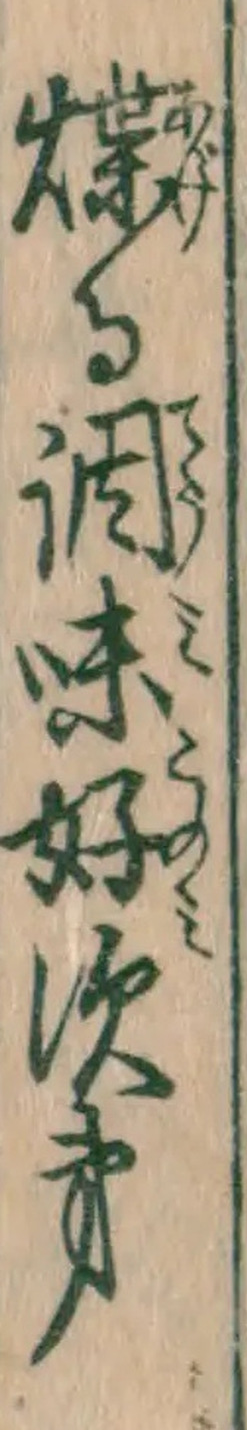煠る調味好次第
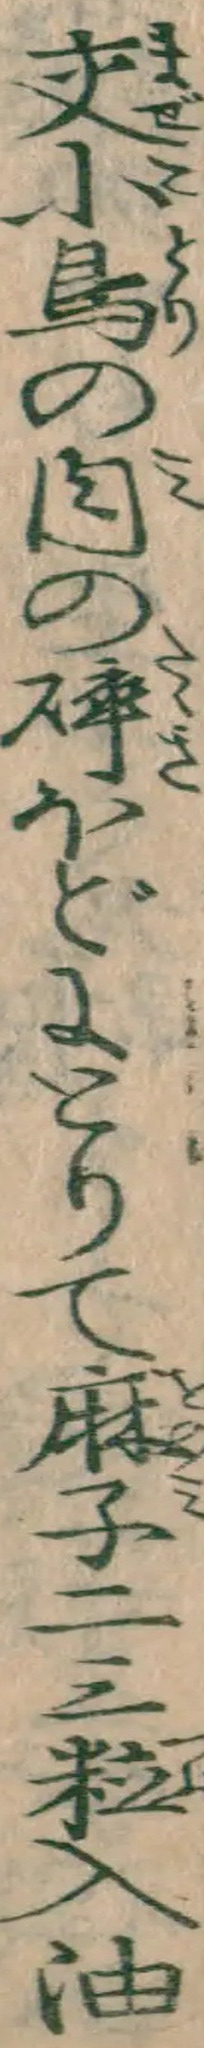交小鳥の肉の碎ほどにとりて麻子二三粒入油
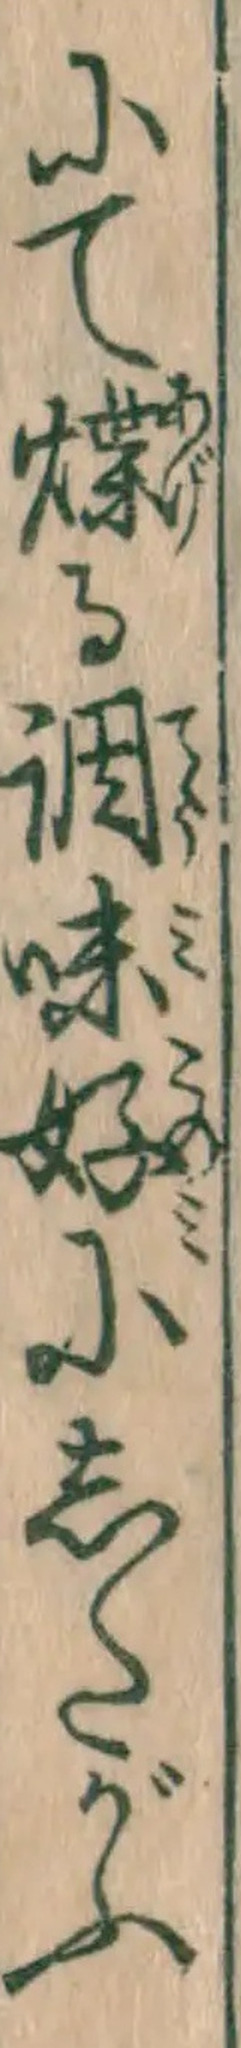にて煠る調味好にしたがふ
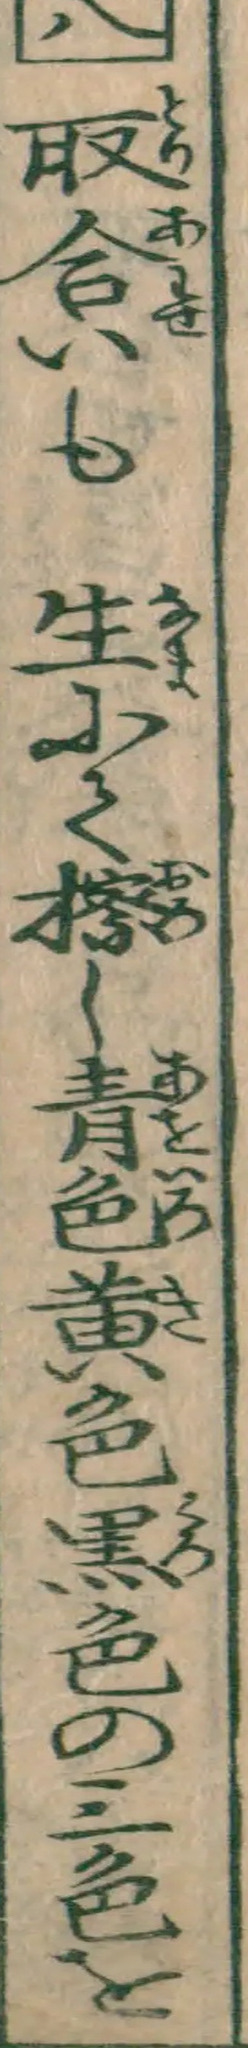[廿八]取合いも生にて擦し青色黄色黒色の三色を

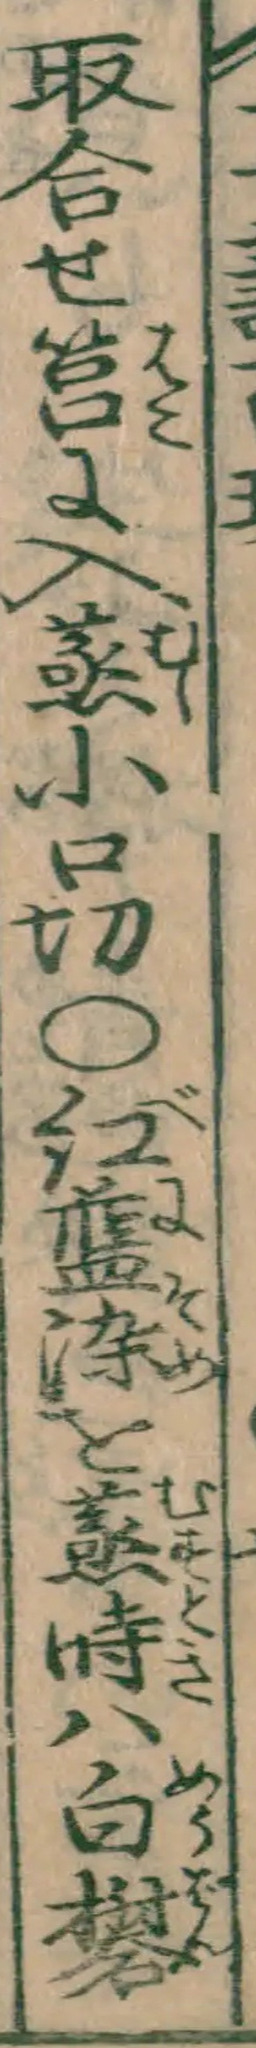取合せ筥に入蒸小口切○紅藍染を蒸時は白礬
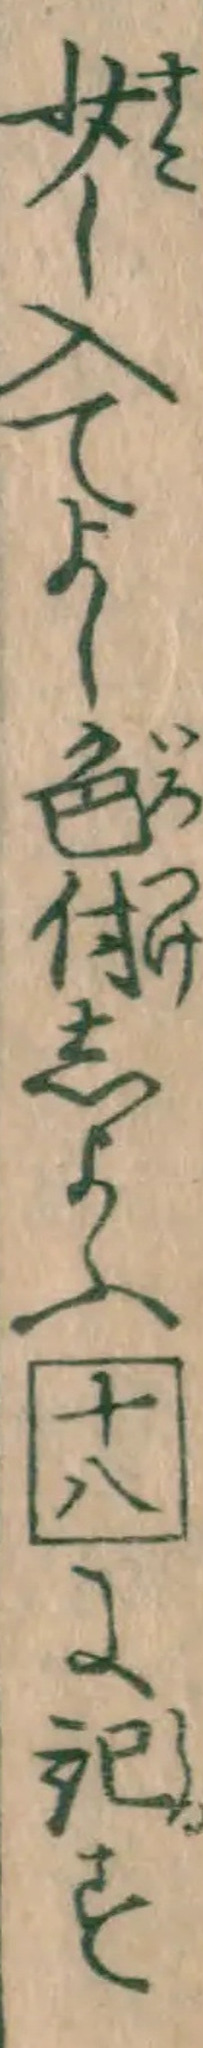少し入てよし色付しよふ[十八]に記す
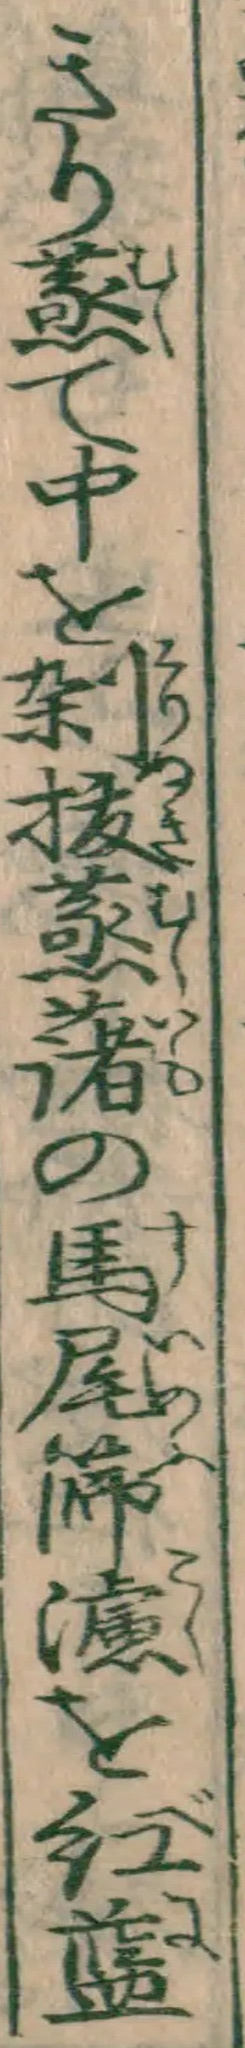きり蒸て中を刴抜蒸藷の馬尾篩濾を紅藍
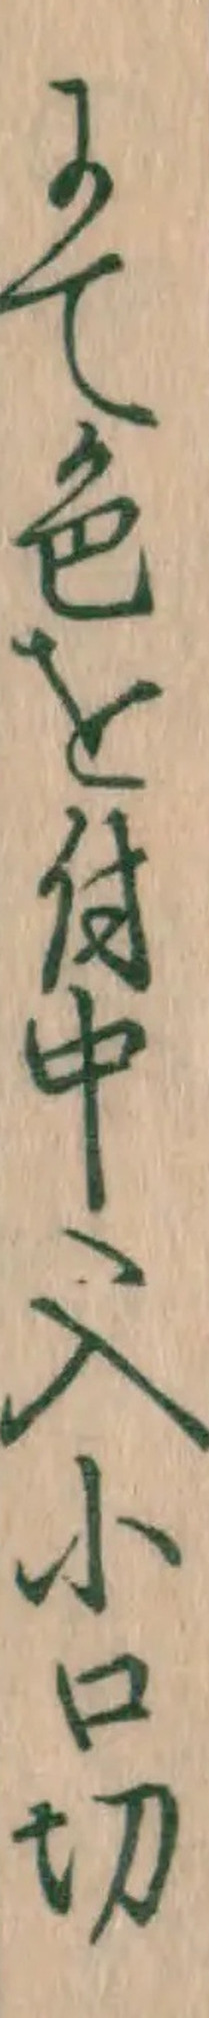にて色を付中へ入小口切
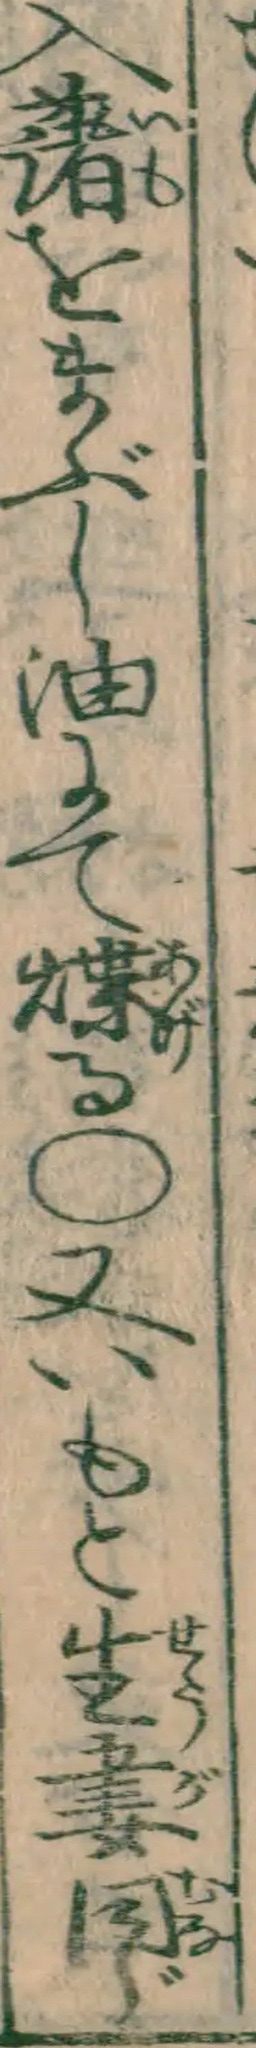入藷をまぶし油にて煠る○又いもと生姜同じ
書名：甘藷百珍
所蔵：国立国会図書館 National Diet Library, JAPAN
